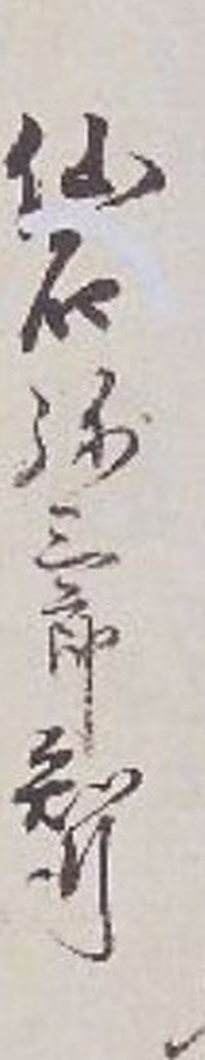仙石弥三郎知行
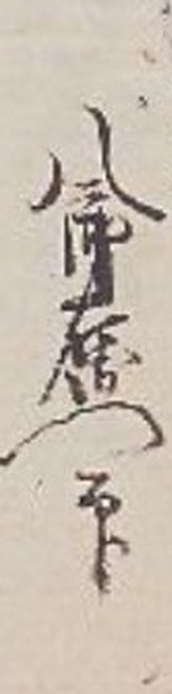八郎左衛門印
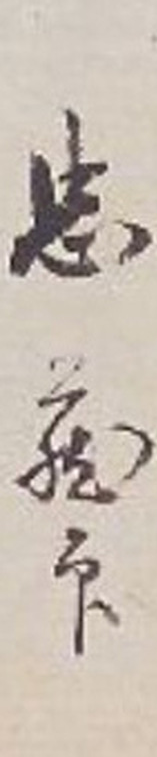忠蔵印
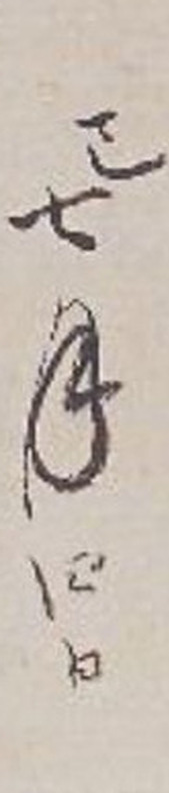巳七月四日

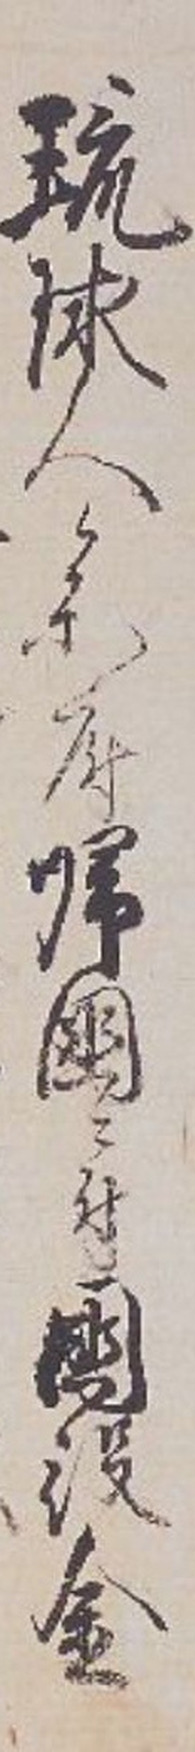琉球人参府帰国に付国役金
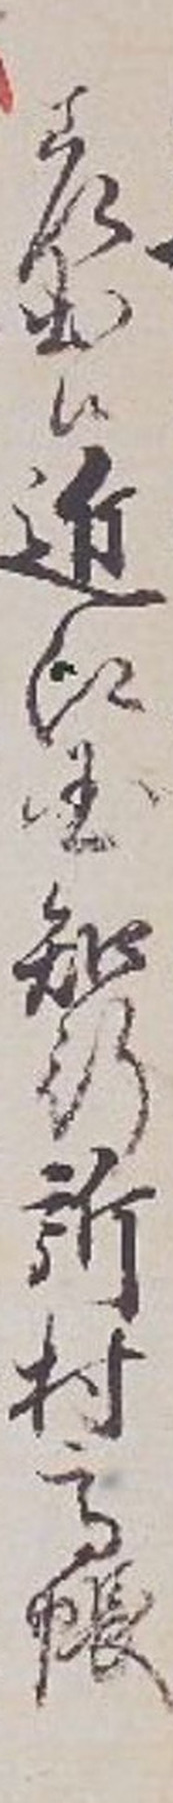差出候近江国知行所村高帳
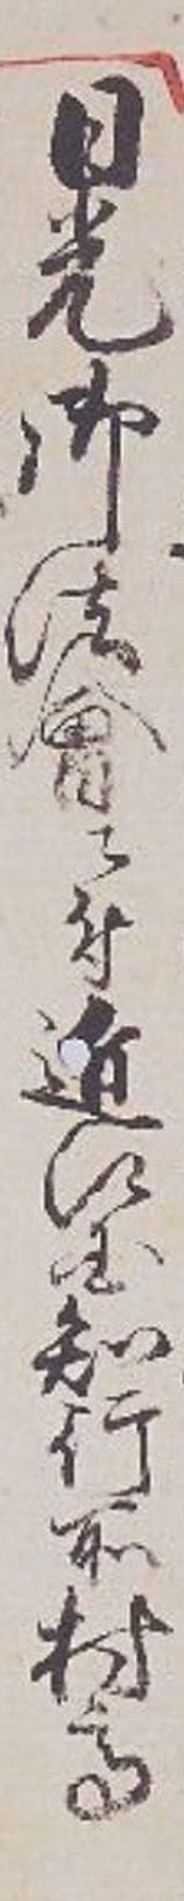日光御法会に付近江国知行所村高
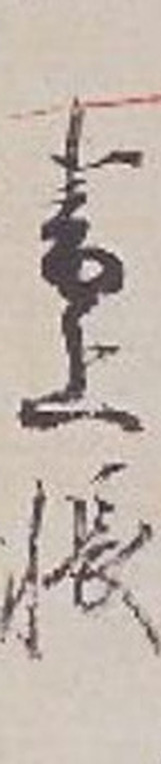書上帳
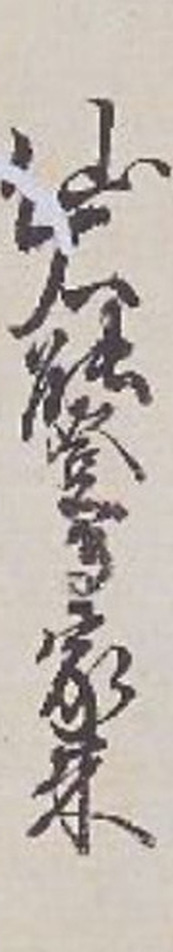仙石能登守家来
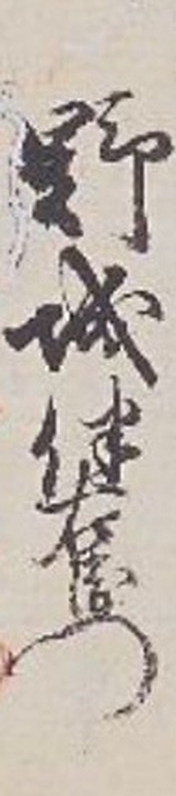野城伴右衛門
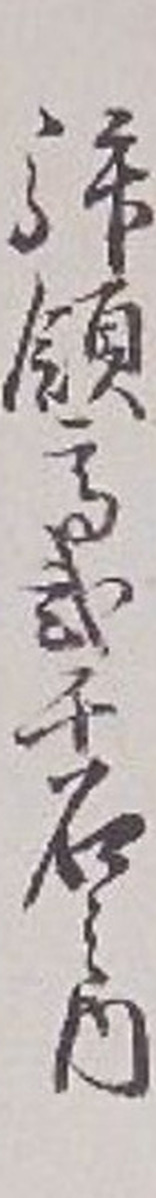拝領高弐千石之内
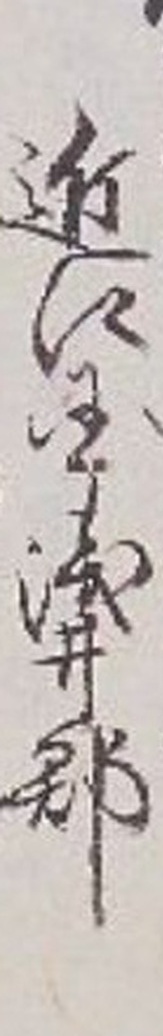近江国浅井郡
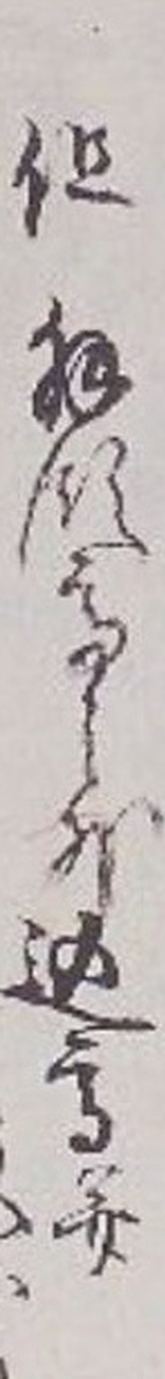但拝領高之外込高幷
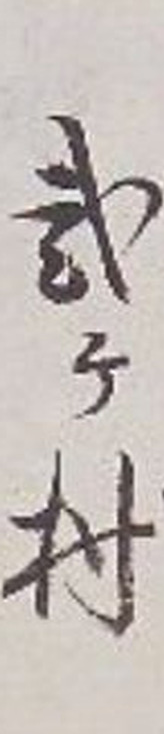弐ヶ村
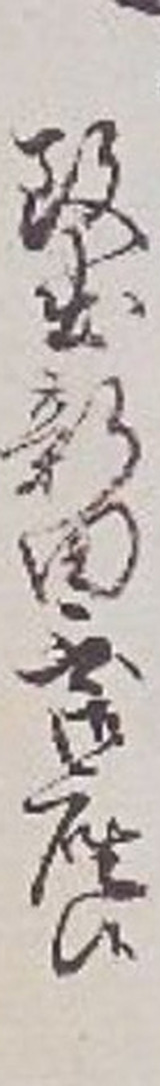改出新田無御座候
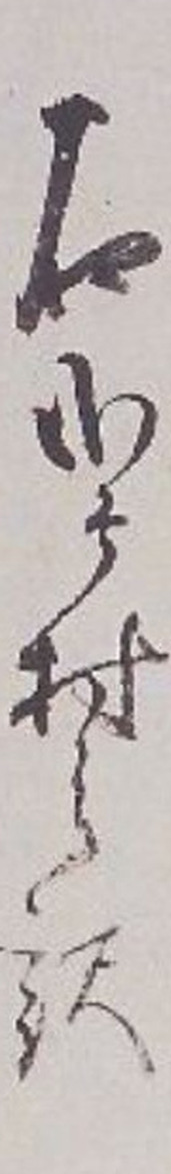右弐ヶ村之訳
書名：琉球人帰国に付国役金の記録
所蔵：University of the Ryukyus Library
